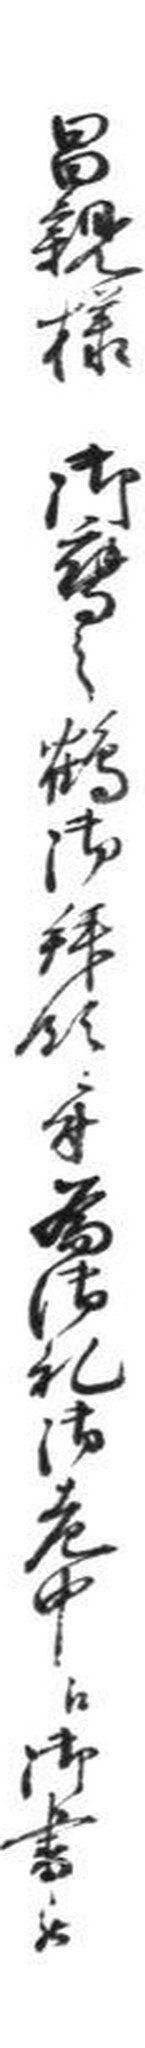昌親様御鷹之鶴御拝領ニ付為御礼御老中江御書被
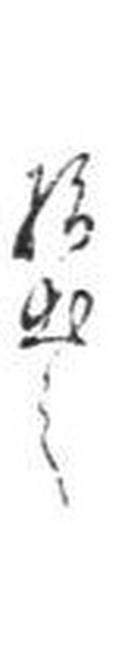指出之
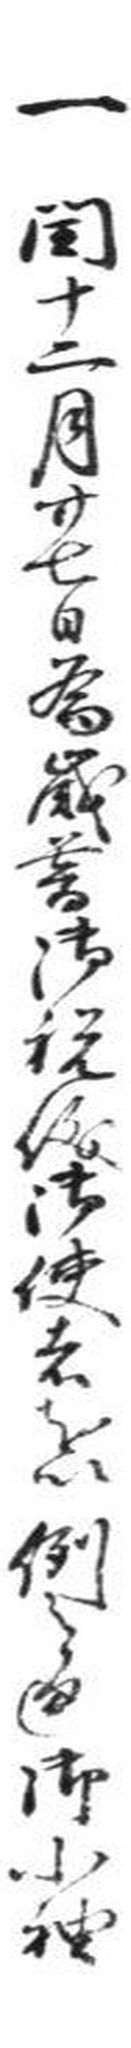一閏十二月二十七日為歳暮御祝儀御使者を以例之通御小袖
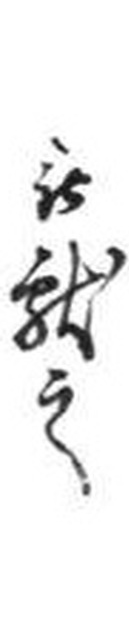被献之
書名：家譜 十三 綱昌公 従寛文元年到延宝五年
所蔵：福井県文書館 Fukui Prefectural Archives
